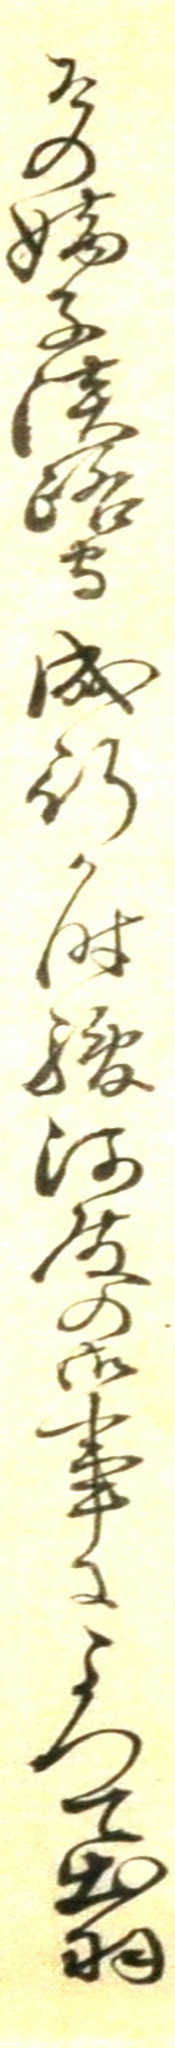その嫡子淡路守成行か時駿河殿の御事によつて出羽
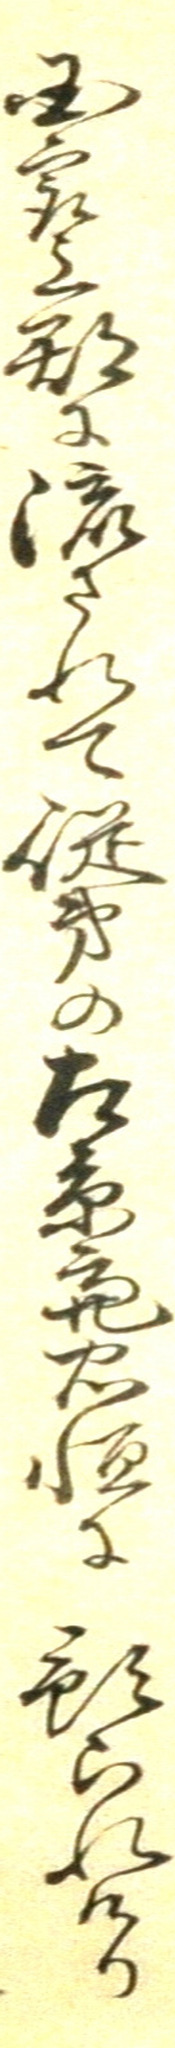国最上郡に流されて従弟の左京亮忠恒に預られけり
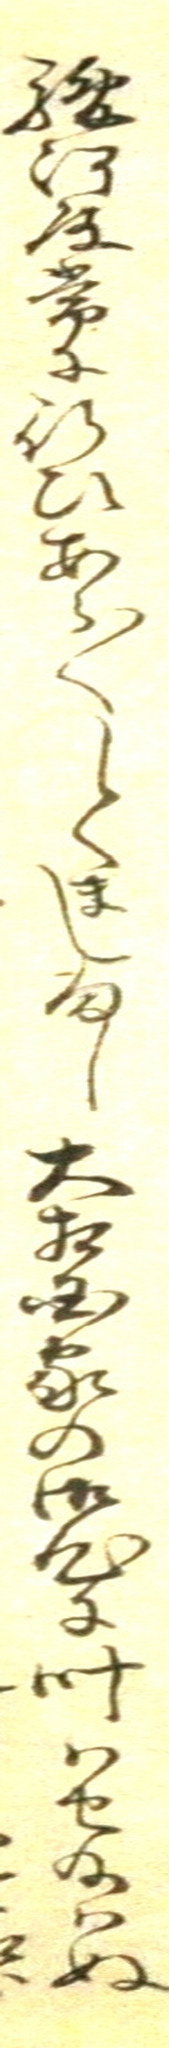駿河殿常に行ひあら〳〵しくましまし大相国家の御心に叶はせ給はぬ
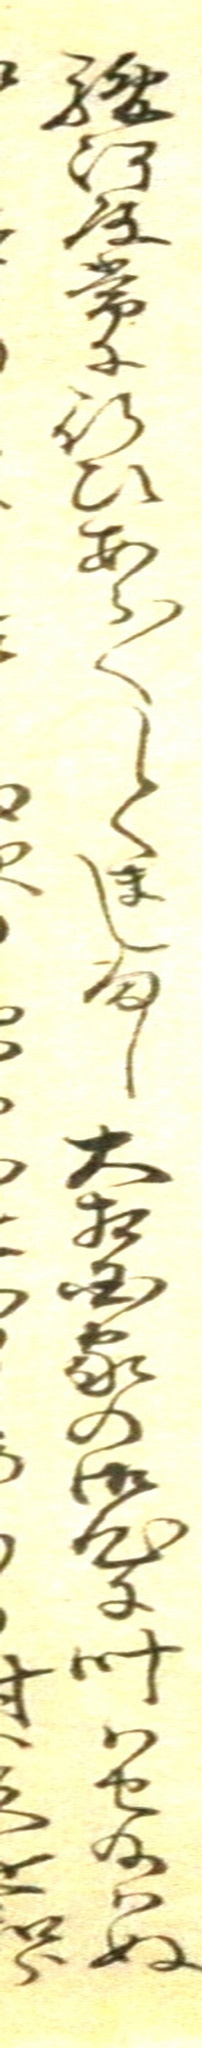駿河殿常に行ひあら〳〵しくましまし大相国家の御心に叶はせ給はぬ
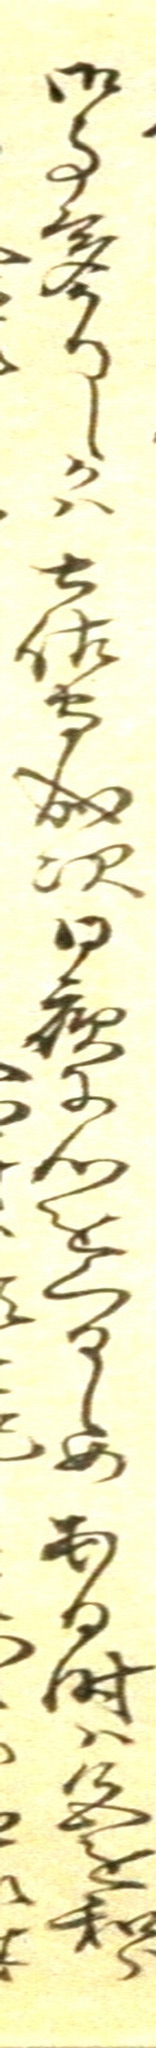御事多かりしかは土佐守成次日夜に心をくるしめある時は色を和ら
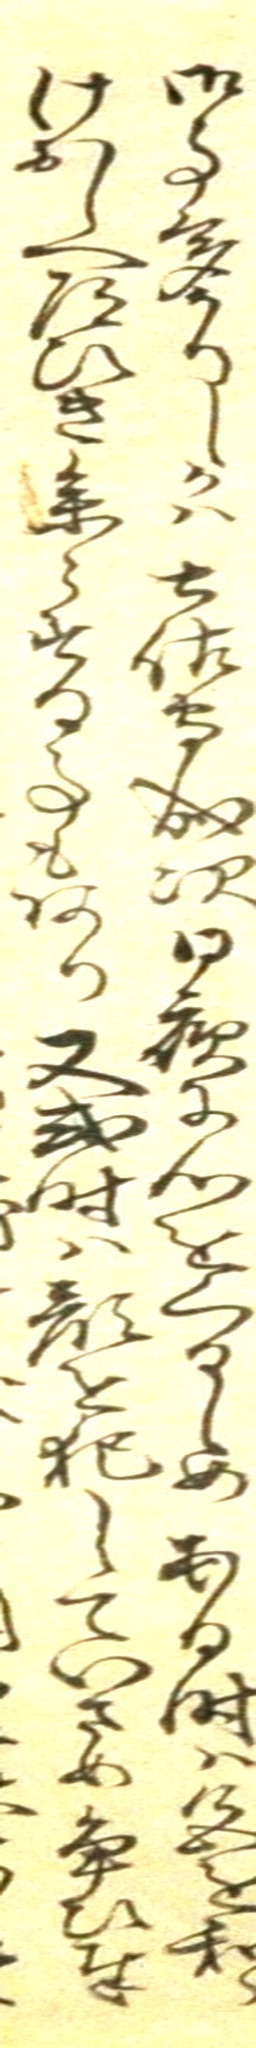けおしへ道ひき参らする事もあり又或時は顔を犯していさめ争ひ奉
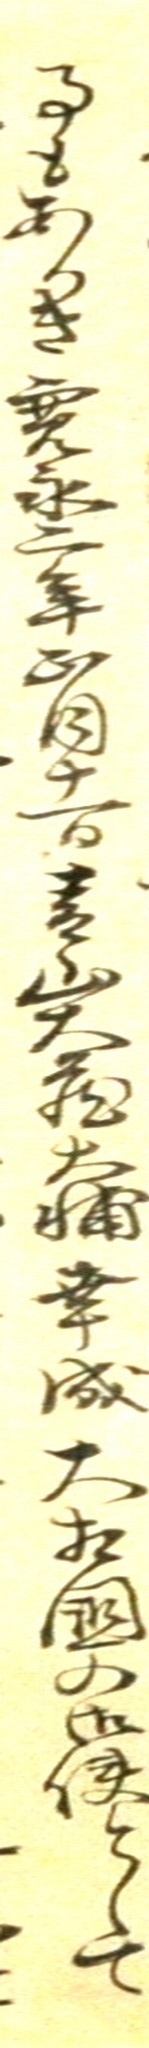事もありき寛永二年正月十一日青山大蔵大輔幸成大相国の御使として
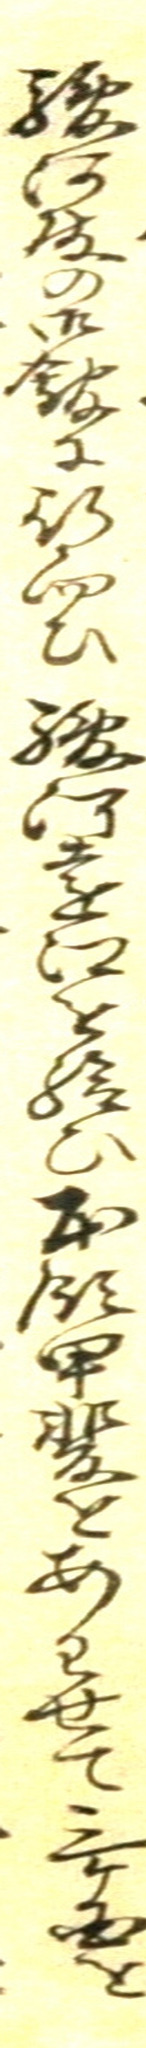駿河殿の御舘に行向ひ駿河遠江を給ひ本領甲斐をあわせて三ヶ国を
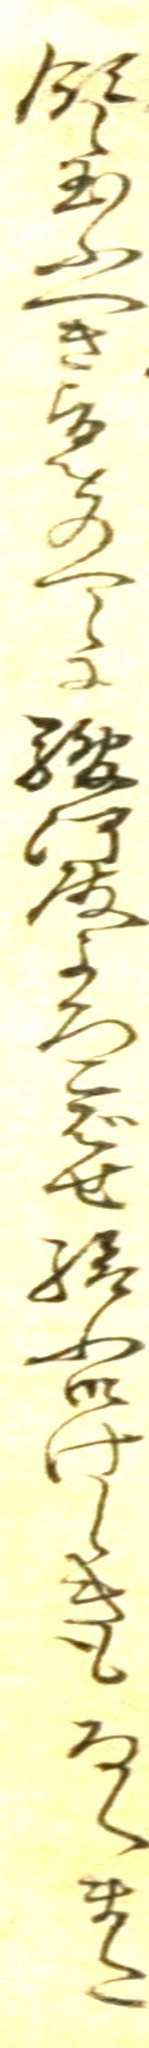領したまふへき旨をのへしに駿河殿よろこばせ給ふ御けしきもなくまた

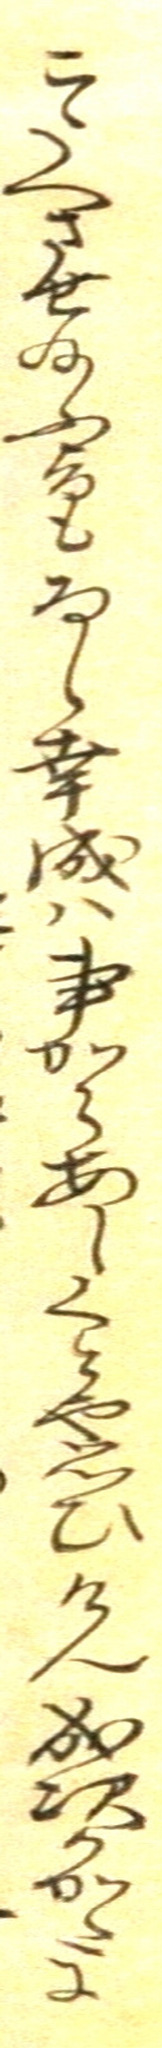こたへさせ給ふ旨もなし幸成は事からあしくとや思ひけん成次かかたに
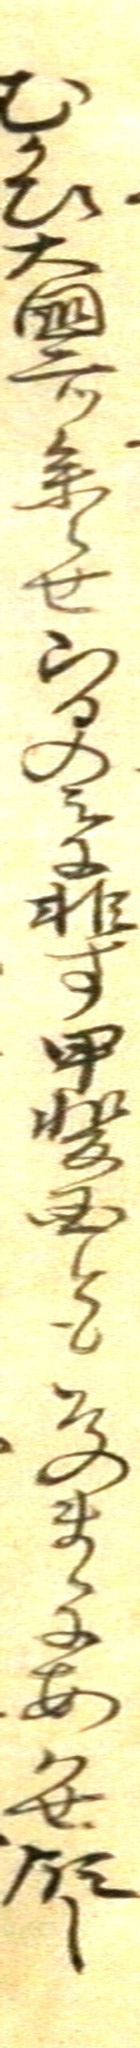むかひ大国二ツ参らせらるのみに非す甲斐国ともそのまゝにあはせ領し
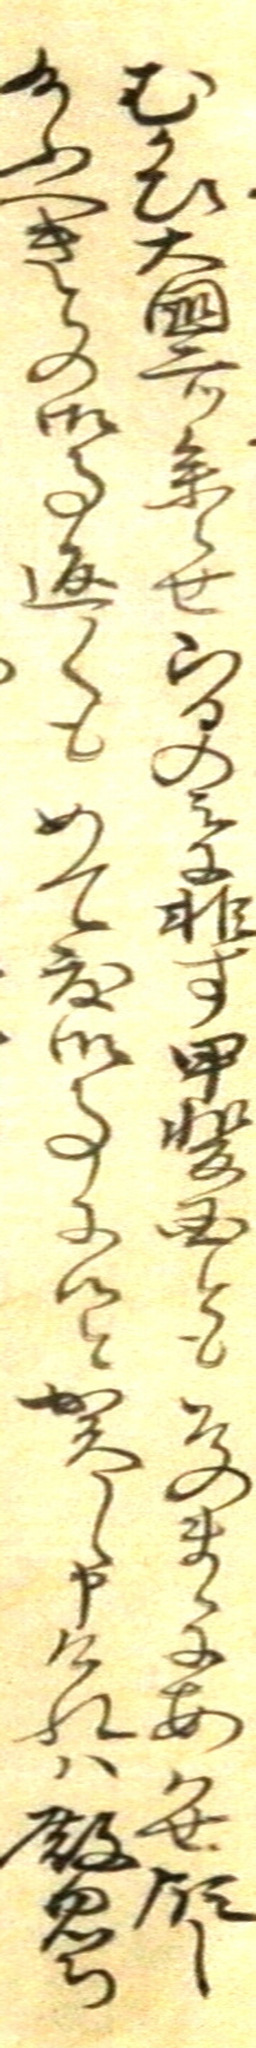給ふへきとの御事返〳〵もめて度御事に候と賀し申けれは殿忽ち
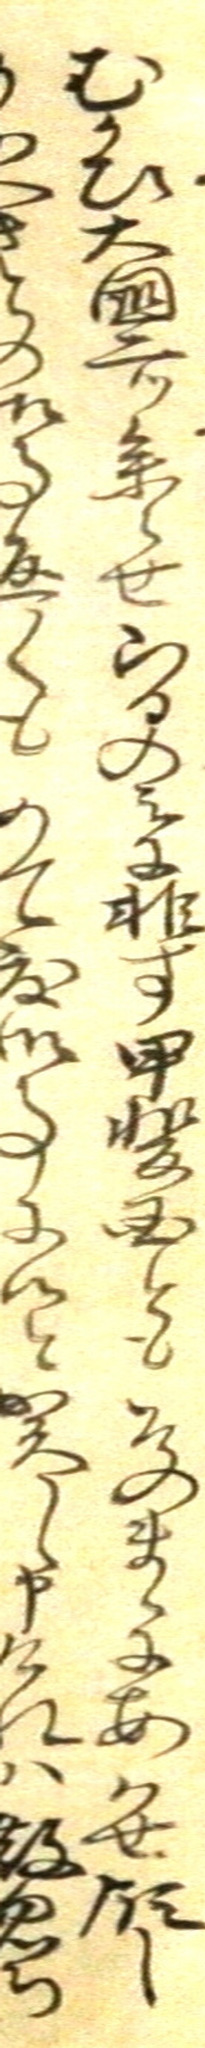給ふへきとの御事返〳〵もめて度御事に候と賀し申けれは殿忽ち
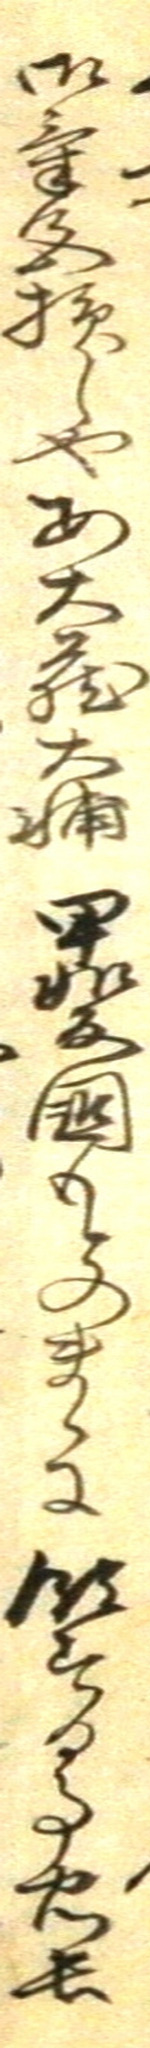御気色損しやあ大蔵大輔甲斐国もとのまゝに領する事忠長
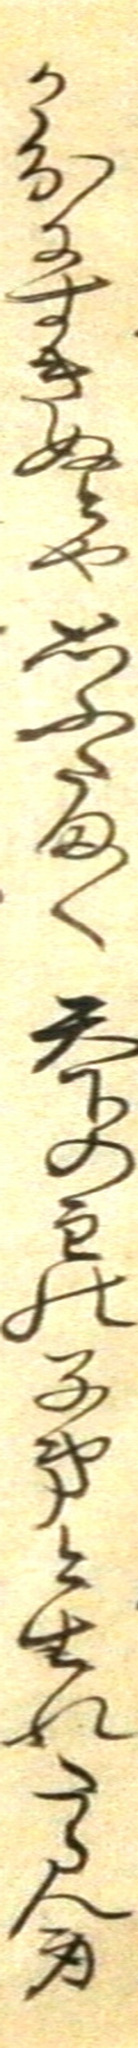か分にすきぬとや思ふたま〳〵天下の主の子弟と生れたらん身
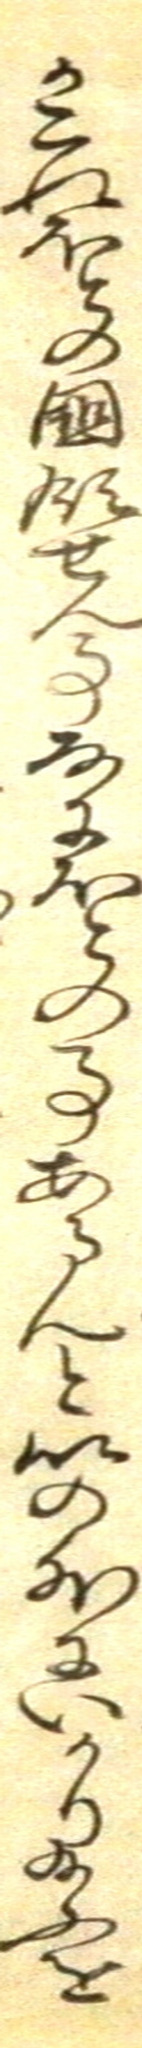かこれほとの国領せん事なにほとの事あらんと以の外にいかり給ふを
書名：藩翰譜（四・中）
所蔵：伊那市立高遠町図書館・合同会社AMANE
